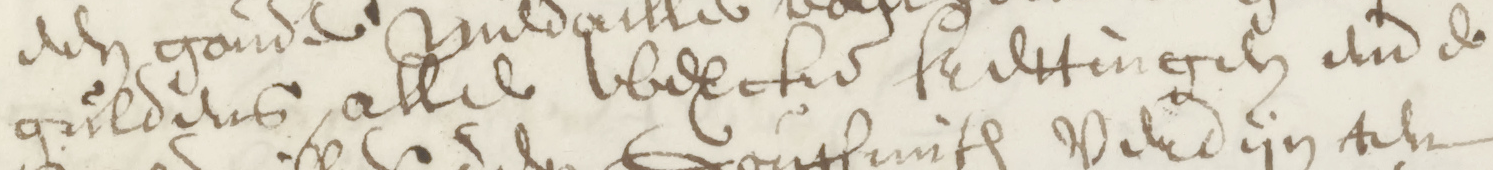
guldens, alle welcke Kettingen ende
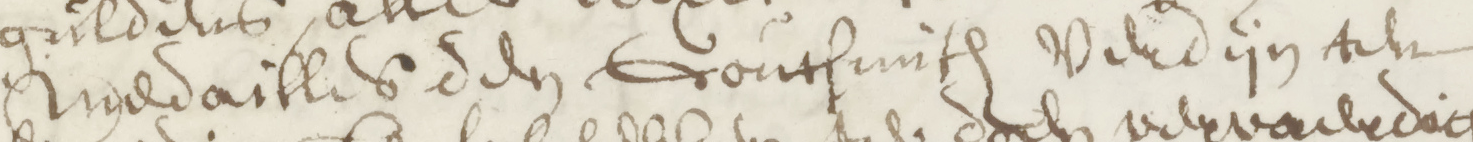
Medailles den Goutsmith Verdijn ten
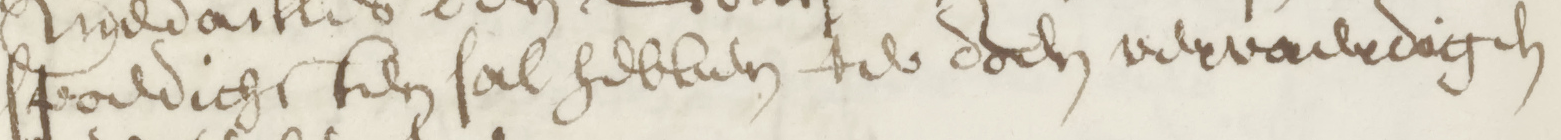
spoedichsten sal hebben te doen vervaerdigen
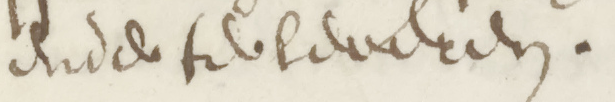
ende te leveren.
